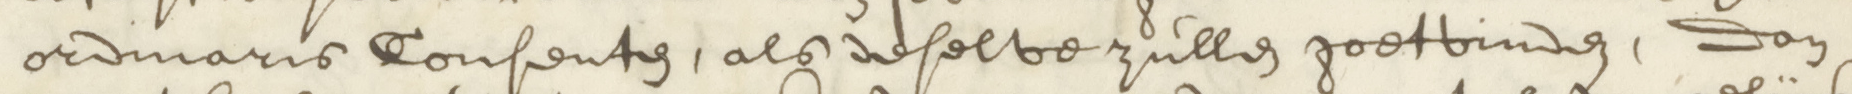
ordinaris Consenten, als deselve zullen goetvinden. Dan
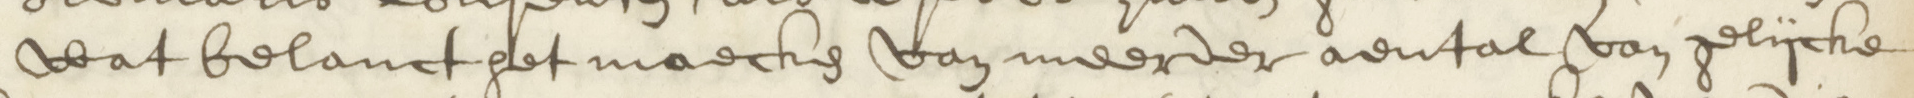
wat belanct het maecken van meerder aental van gelijcke
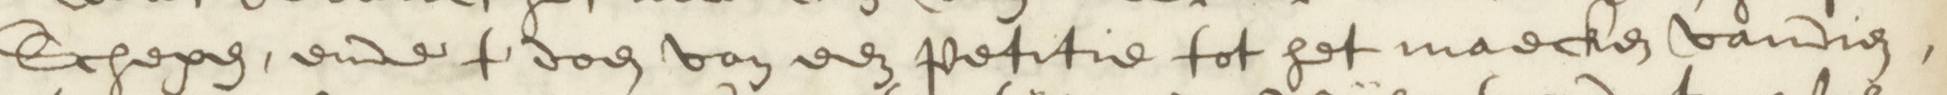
Schepen, ende t‛doen van een petitie tot het maecken vandien,
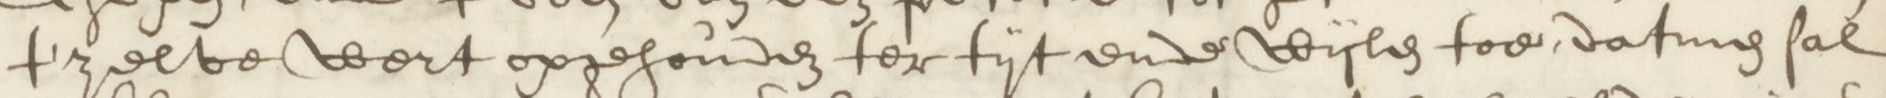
t'zelve wert opgehouden ter tijt ende wijlen toe, datmen sal
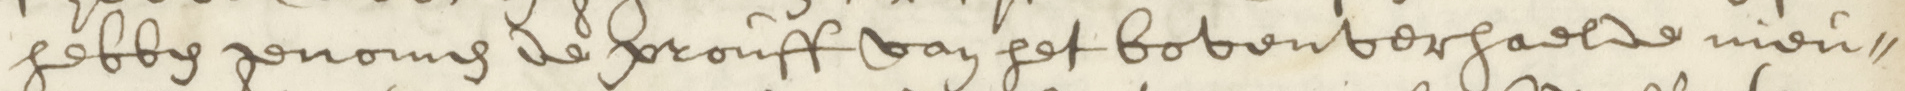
hebben genomen de prouff van het bovenverhaelde nieu„
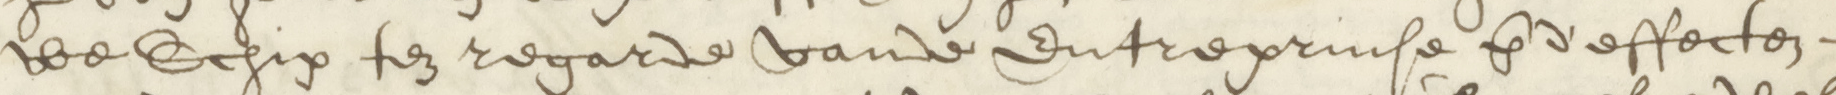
we Schip ten regarde vande Entreprinse & d'effecten —
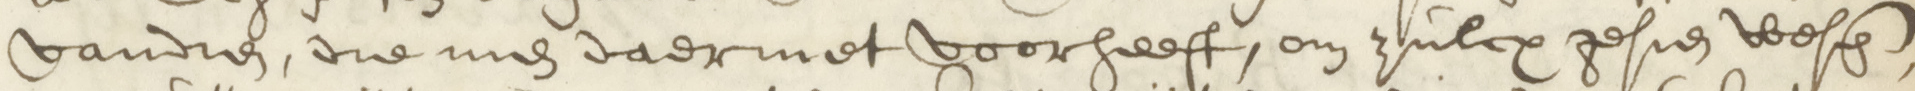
vandien, die men daermet voorheeft, om zulcx gesien wesen
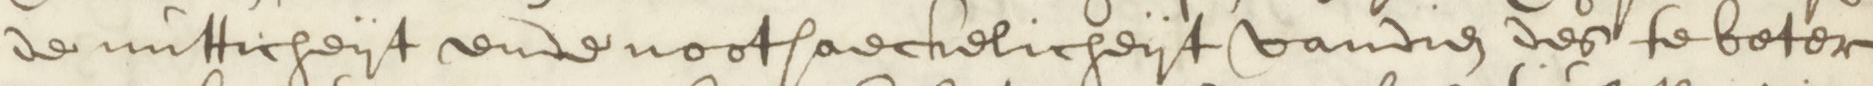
de nutticheijt ende nootsaeckelicheijt vandien des te beter
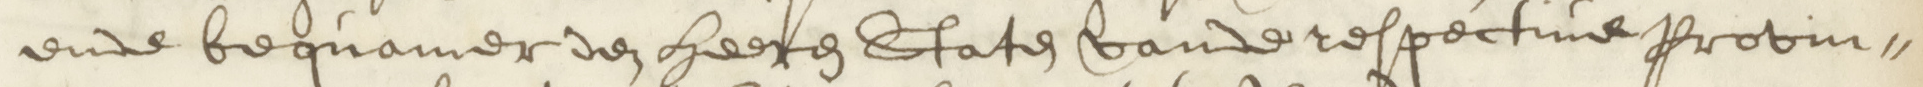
ende bequamer den heeren Staten vande respectiue Provin„
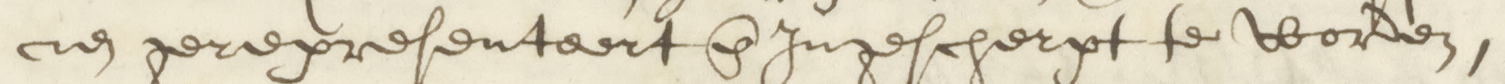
cien gerepresenteert & Ingescherpt te worden.
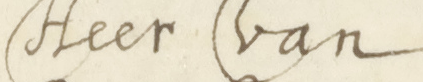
Heer van
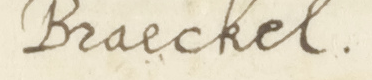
Braeckel.
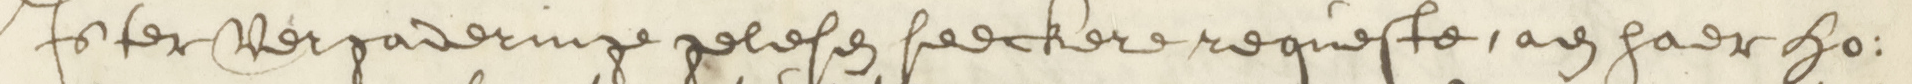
Is ter Vergaderinge gelesen seeckere requeste, aen haer Ho:
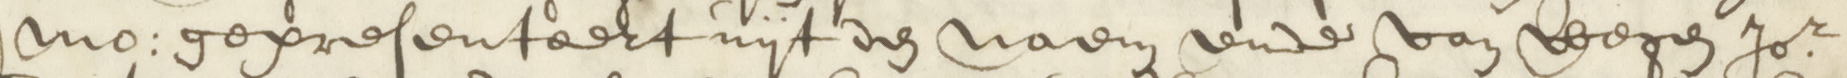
Mo: gepresenteert uijt den naem ende van wegen Jor.
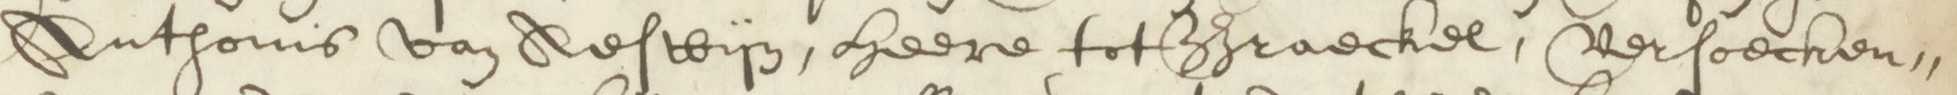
Anthonis van Aeswijn, heere tot Braeckel, versoecken„
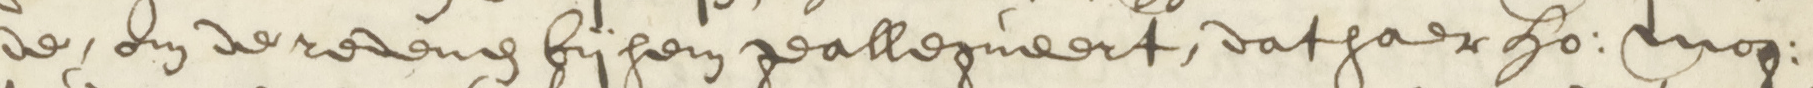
de, om de redenen bij hem geallegueert, dat haer Ho:Mog:
